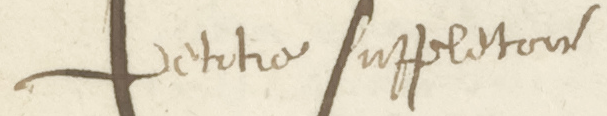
Petitie Suppletoir
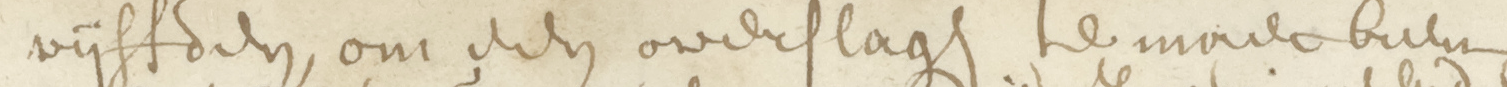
vijffden, om een overslagh te maecken
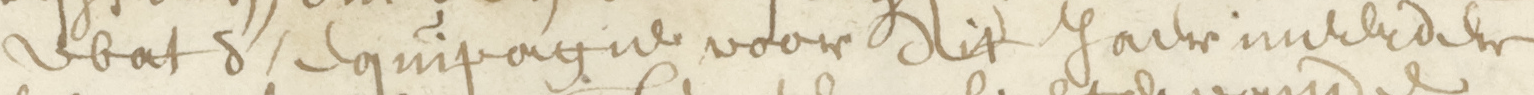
wat d'Equipagie voor dit Jaer meerder
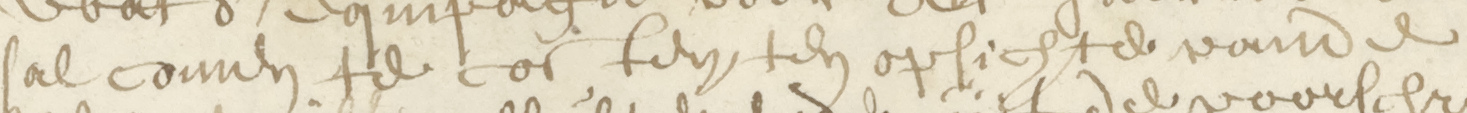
sal comen te costen, ten opsichte vande
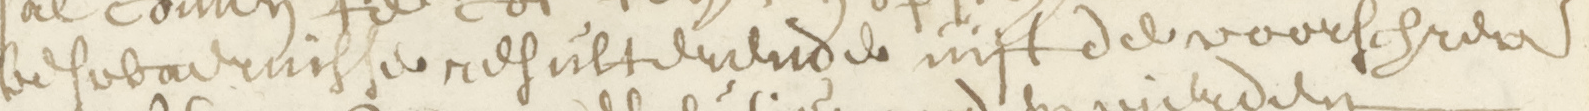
beswaernisse resulterende uijt de voorschreve
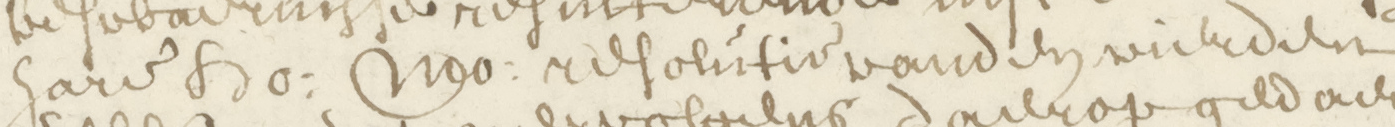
hare Ho:Mo: resolutie vanden vierden
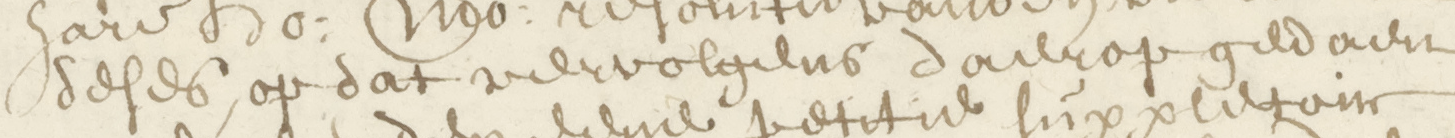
deses, opdat vervolgens daerop gedaen
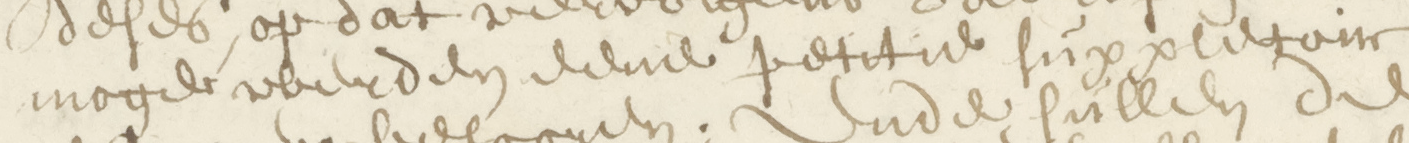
moge werden eene petitie suppletoir
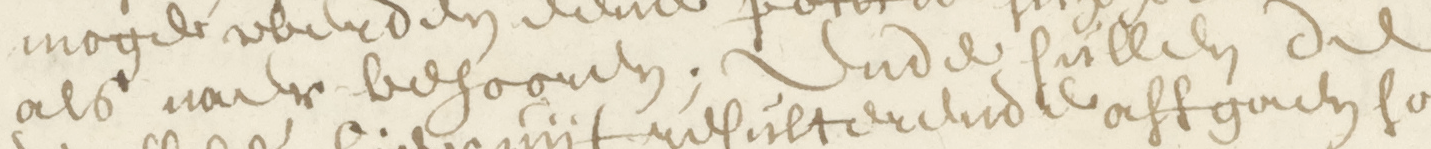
als naer behooren; Ende sullen de
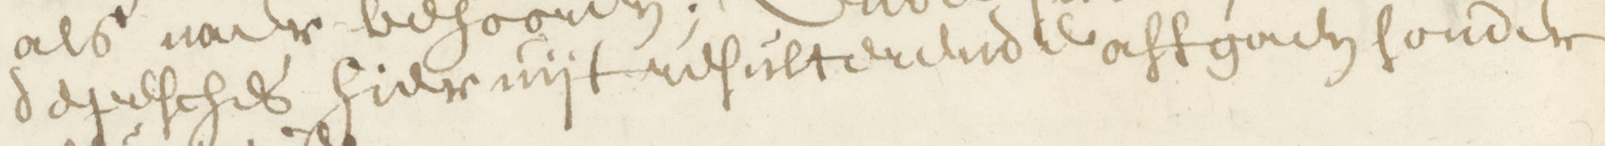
depesches hieruijt resulterende affgaen sonder
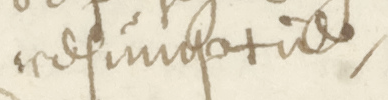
resumptie.
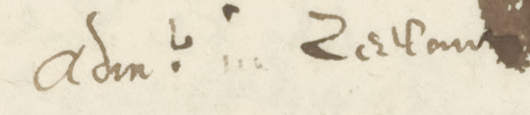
Admt. in Zeelan(dt)
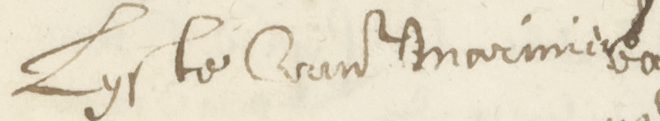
Lyste van Mariniers
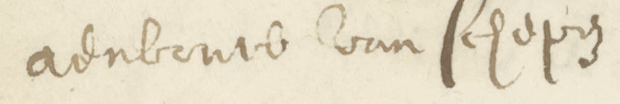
aenbouw van Schepen
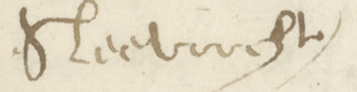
Sleevoocht
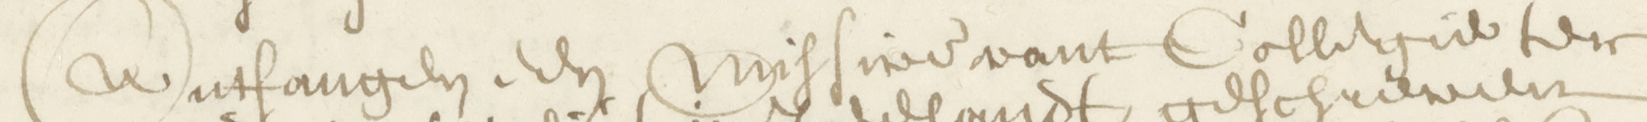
Ontfangen een Missive vant Collegie ter
